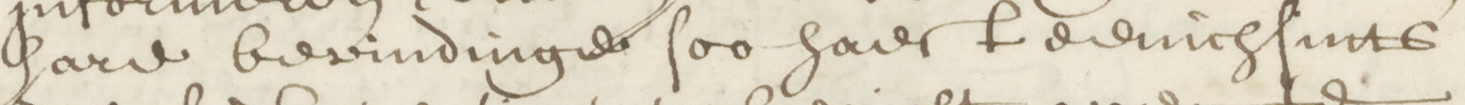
hare bevindinge soo haer t eenichsints
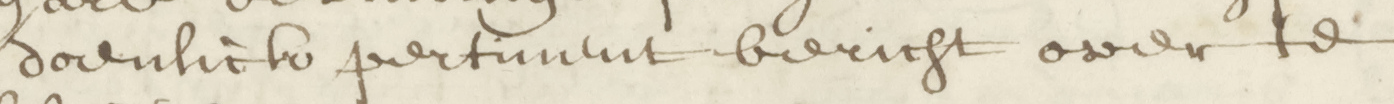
doenlick pertinent bericht over te
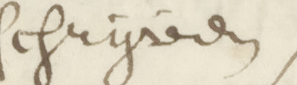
schrijven
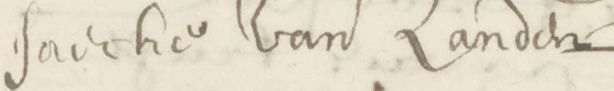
Saecke van Landen
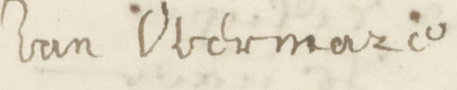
van Overmaze
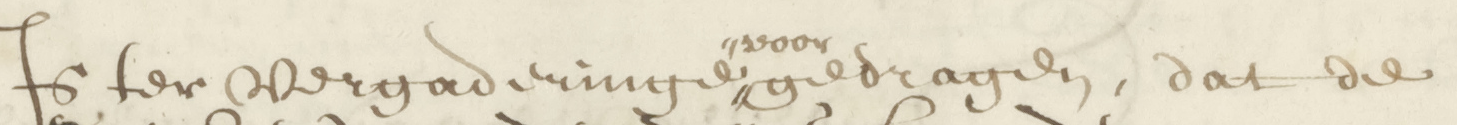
Is ter Vergaderinge voorgedragen, dat de
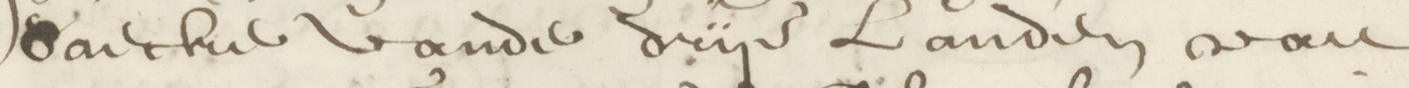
Saecke vande drije Landen van
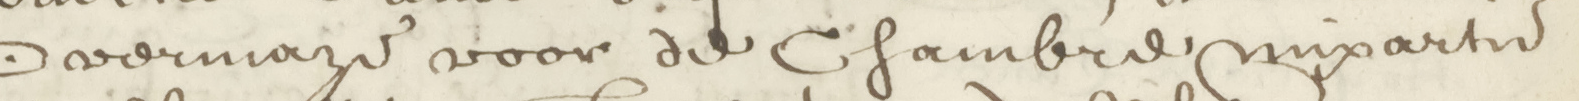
Overmaze voor de Chambre mipartie
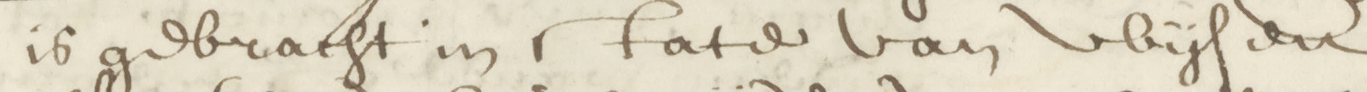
is gebracht in state van wijsen
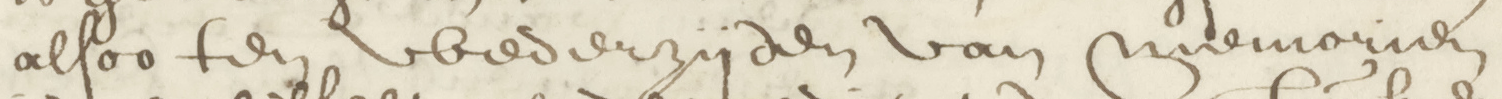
alsoo ten wederzijden van memorien
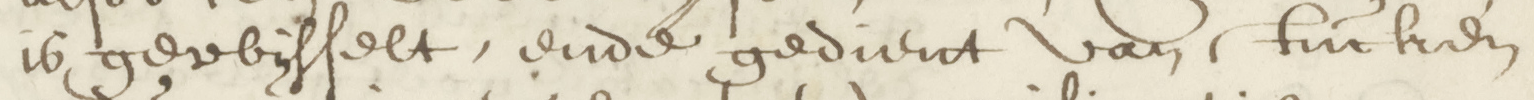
is gewijsselt, ende gedient van stucken
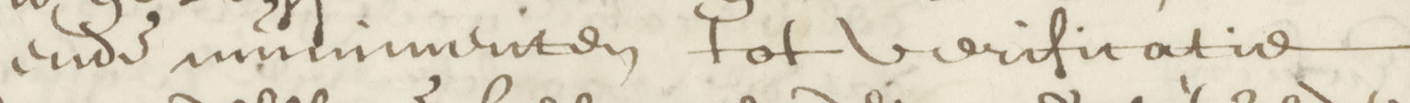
ende minumenten tot verificatie
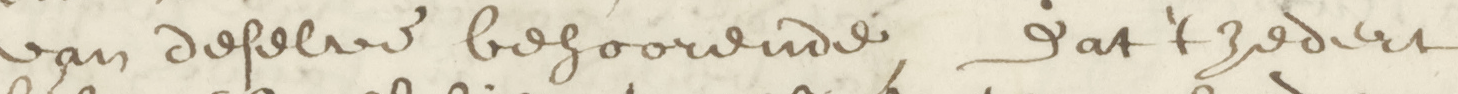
van deselve behoorende, dat ‛t zedert
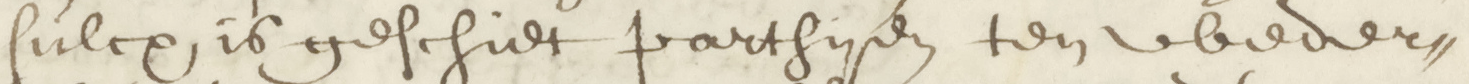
sulcx is geschiet parthijen ten weder„
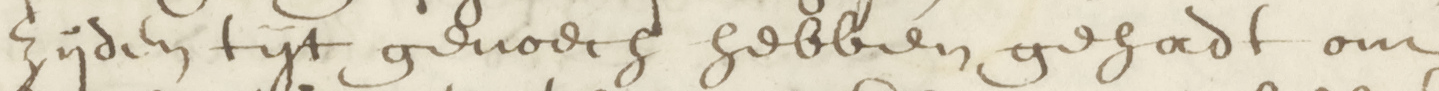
zijden tijt genoech hebben gehadt om
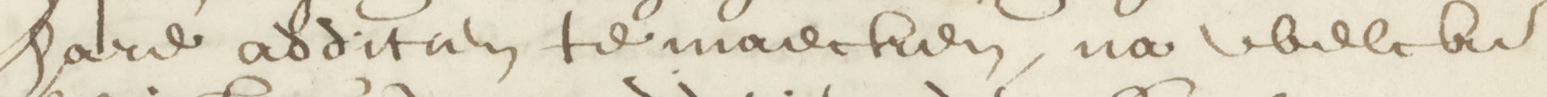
hare additien te maecken, na welcke
